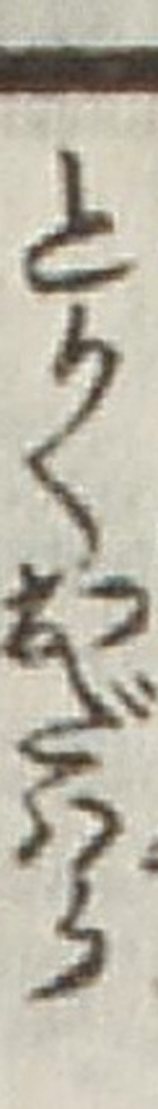とかくおだはら
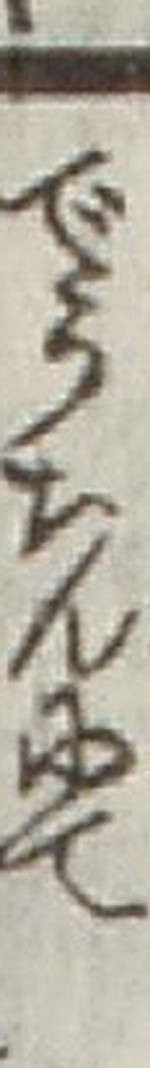でうちんにて
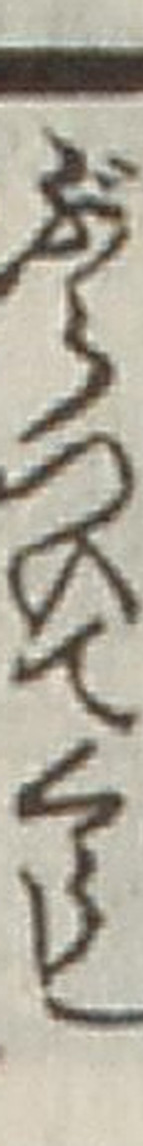ぶらついてくらし
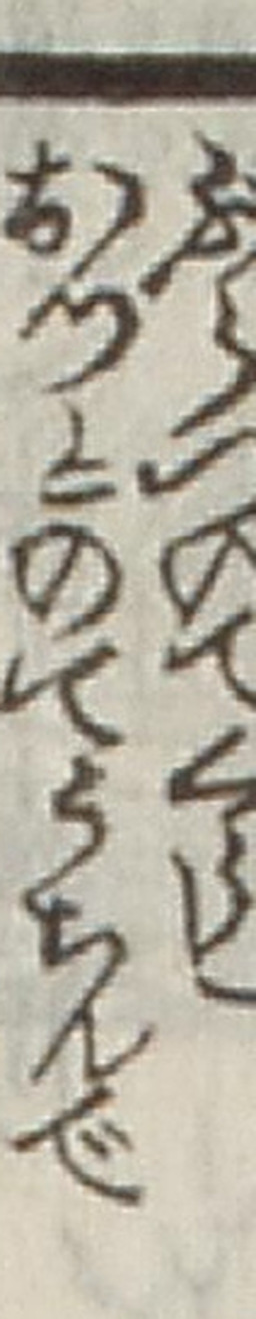おつとのてうちんで
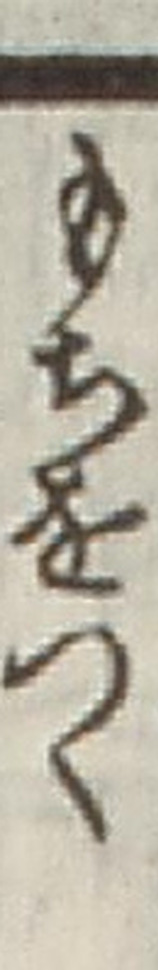もちをつく
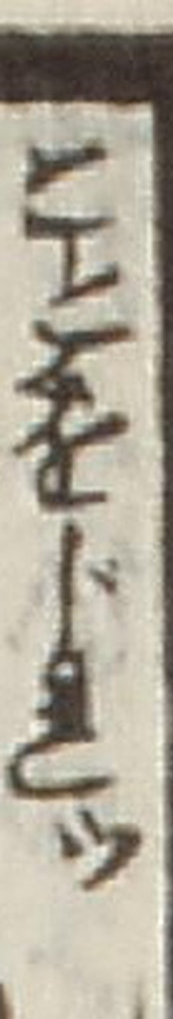ことをじれッ
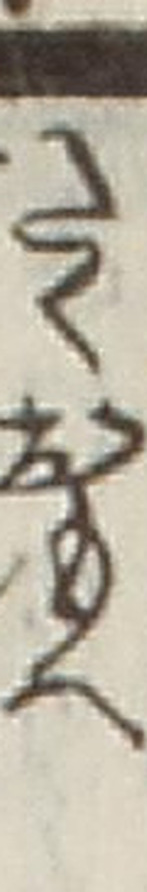たくおもへ
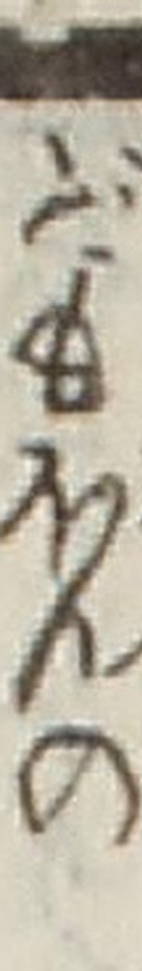どもほんの
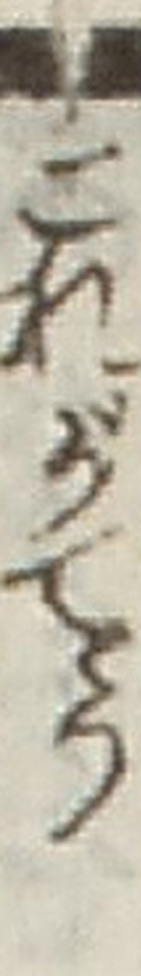これがてう
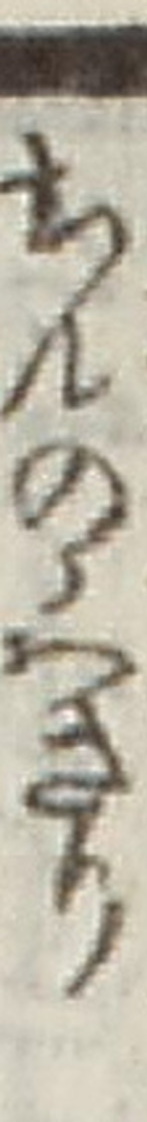ちんのくさり
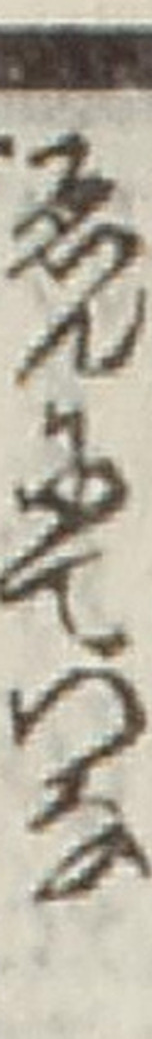ゑんにてつな
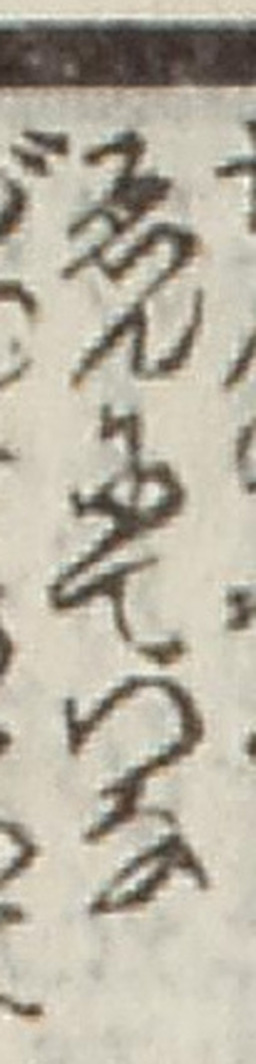ゑんにてつな
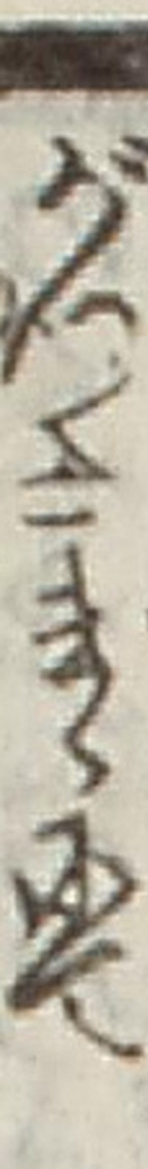がつたまゝにて
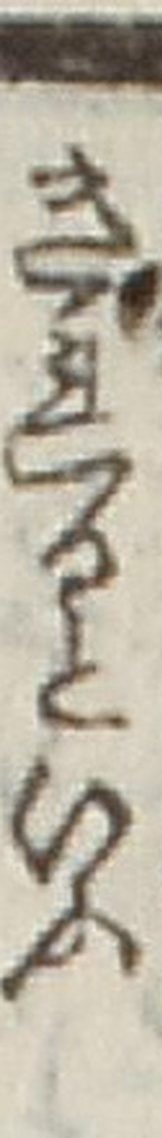きれるといふ
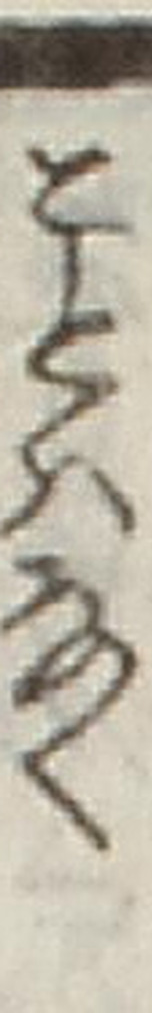ことはなく
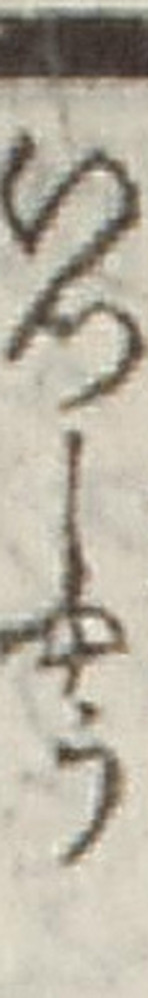いつしやう
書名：三世相出雲當座帳　上下冊
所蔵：東京大学地震研究所図書室 Earthquake Research Institute Library, The University of Tokyo, JAPAN
